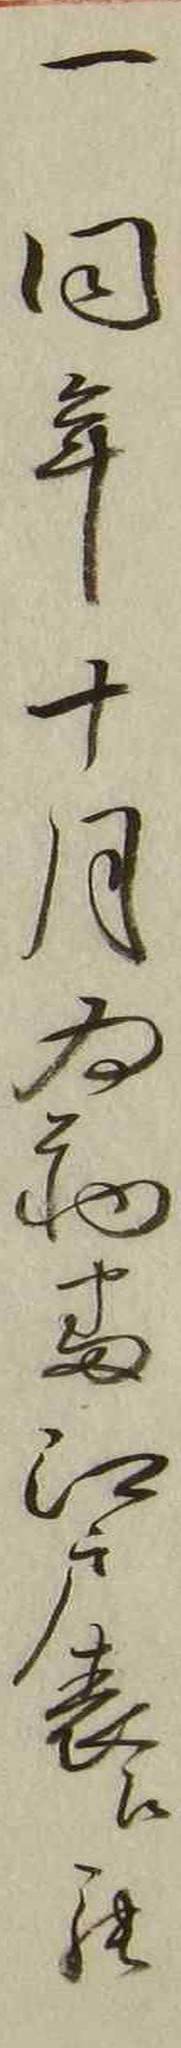一同年十月為勤番江戸表江罷
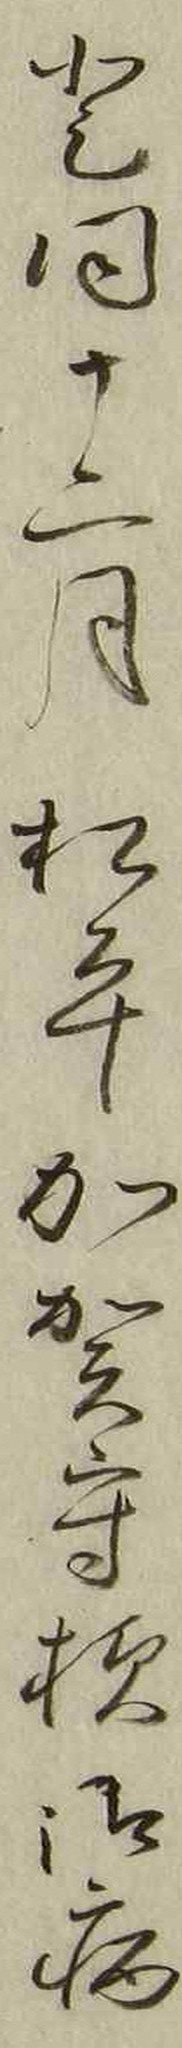登同十二月松平加賀守様御病
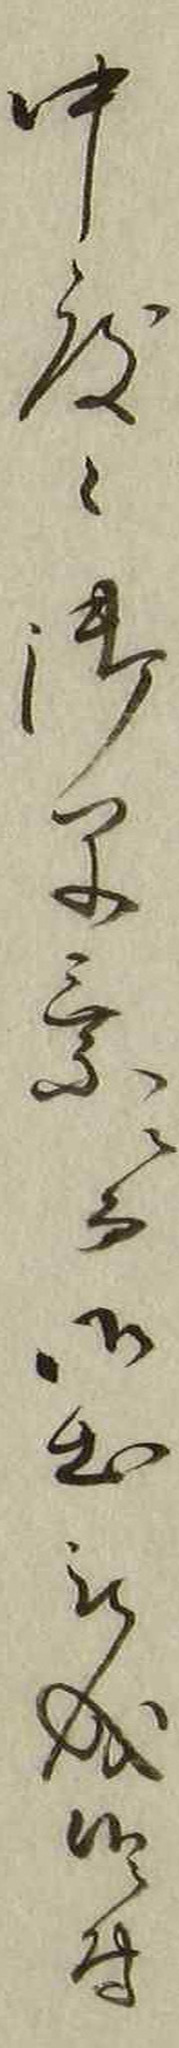中度々御早乗に而御出被成候に付
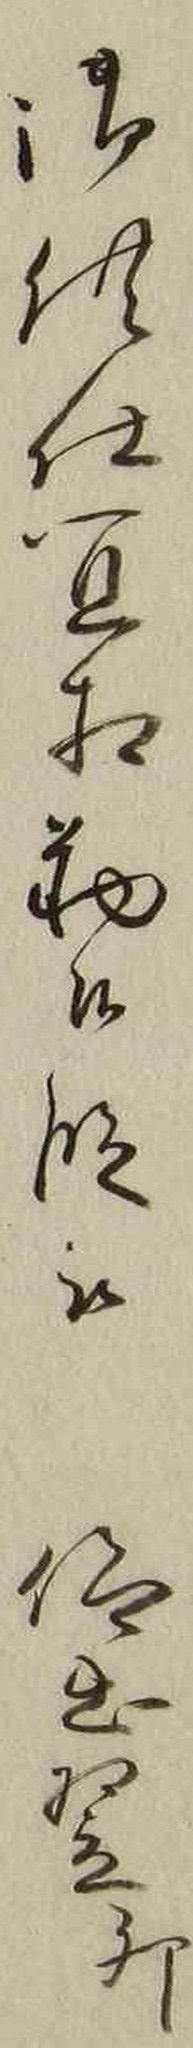御供仕宜相勤候段被仰出翌卯
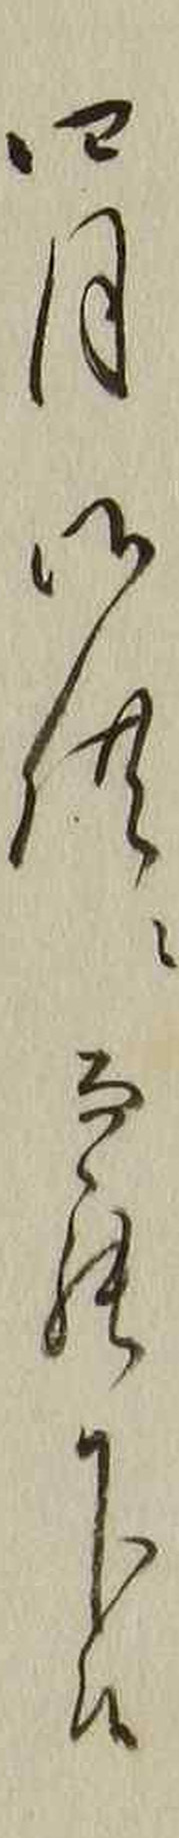四月御供に而罷下候
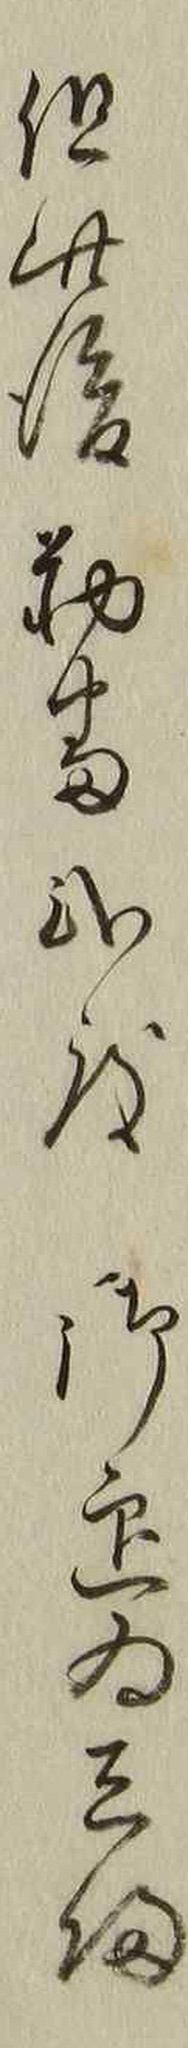但此後勤番弐度御迎為立帰
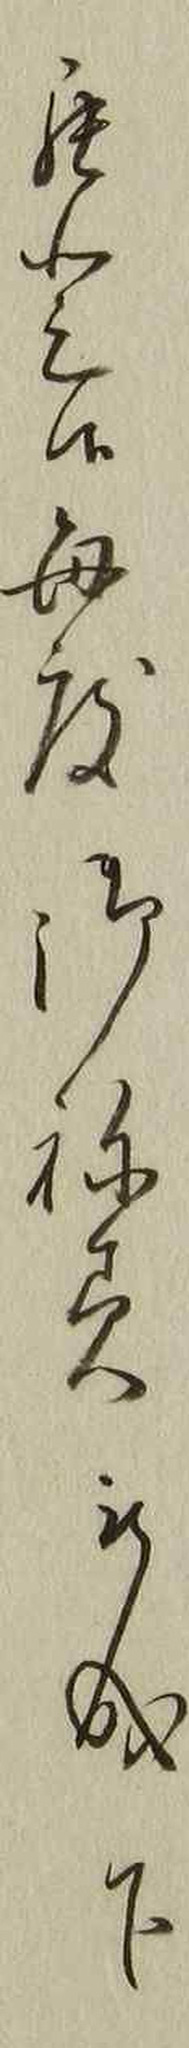罷登候毎度御称美被成下
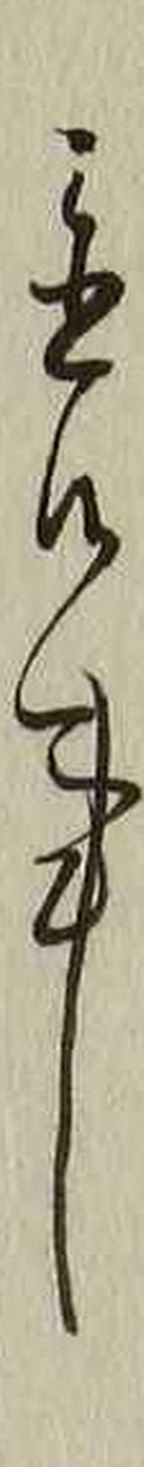置候事
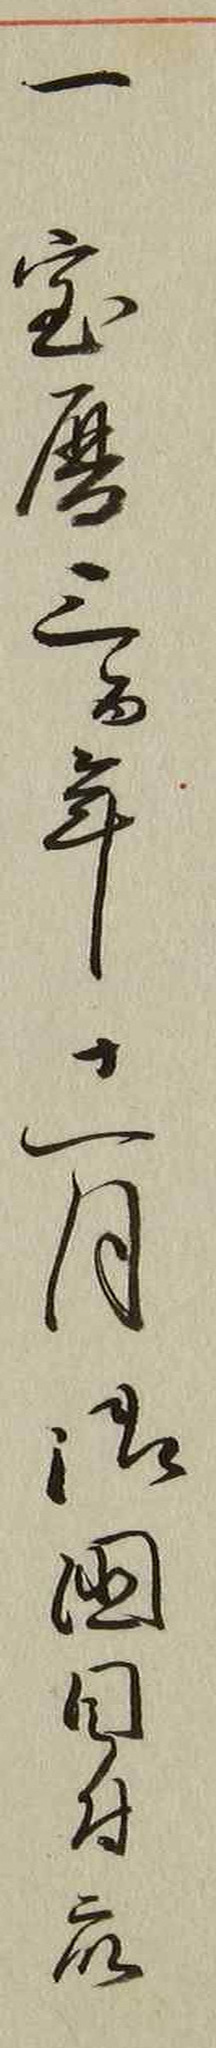一宝暦三酉年十一月御国目付衆
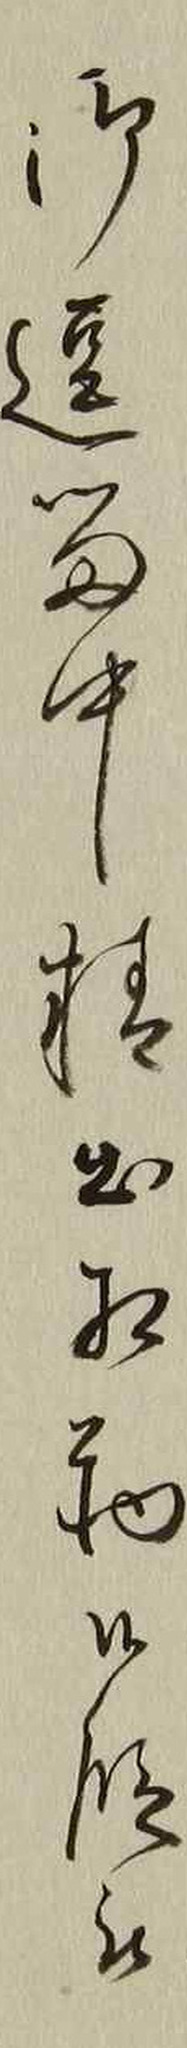御逗留中精出相勤候段被
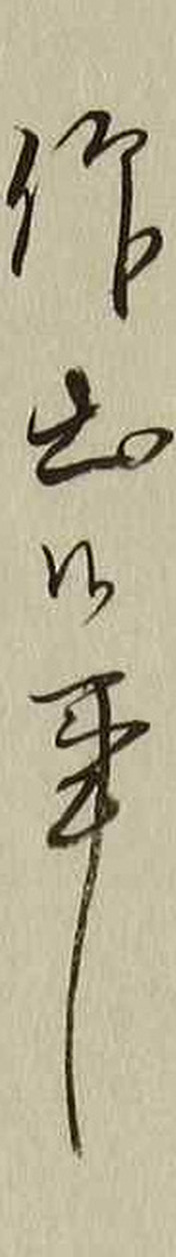仰出候事
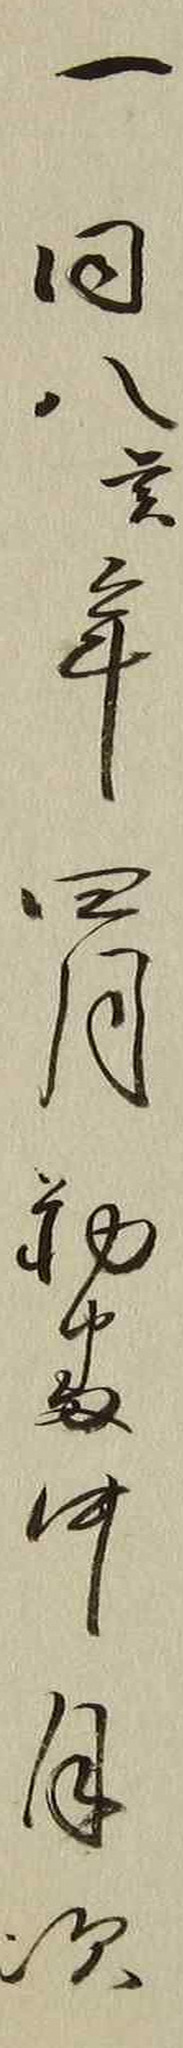一同八亥年四月勤番中月次
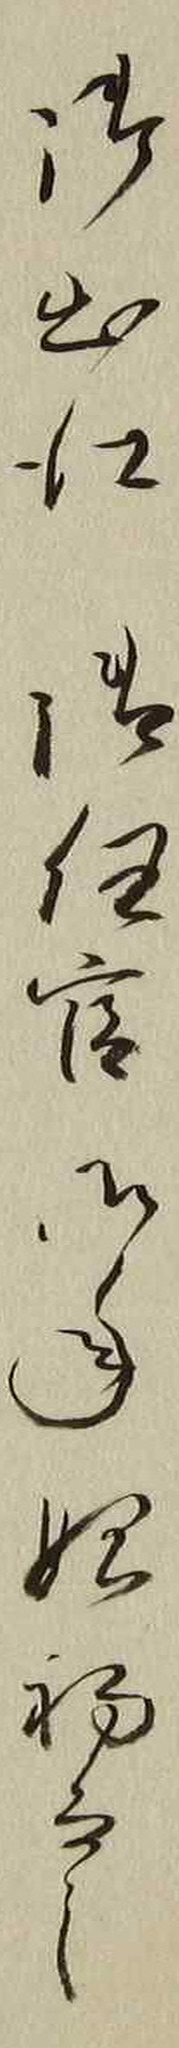御出仕御任官御年始初而之
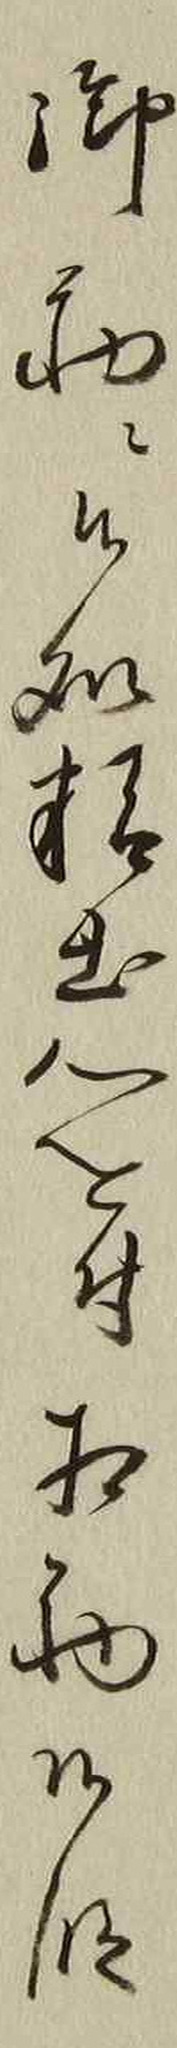御勤に候処精出心を付相勤候段
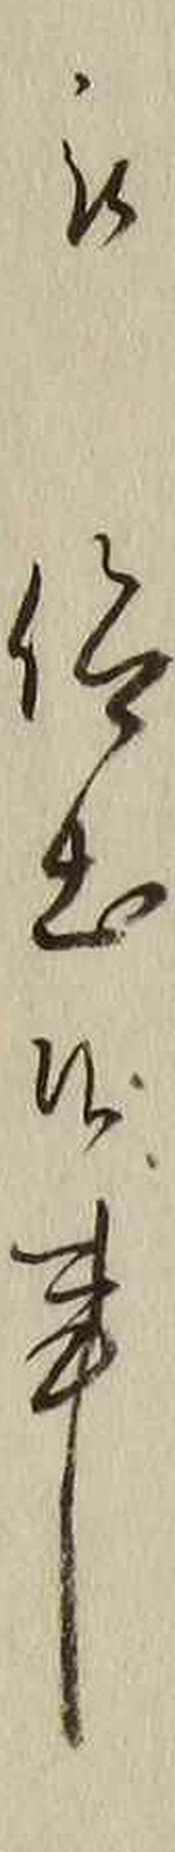被仰出候事
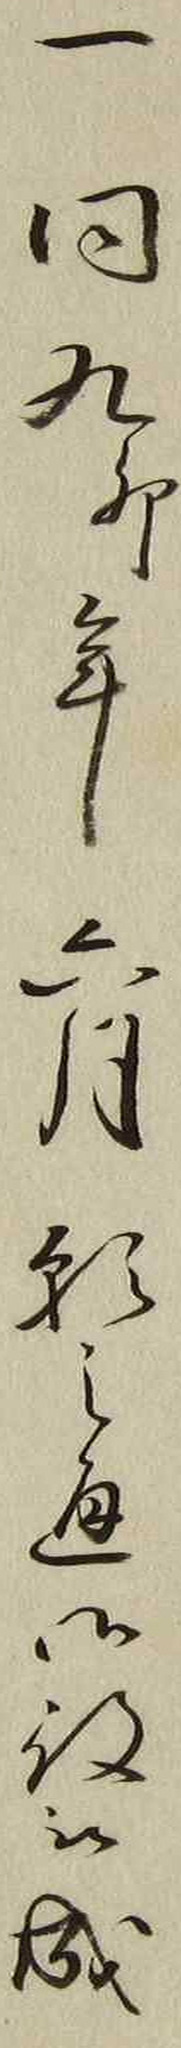一同九卯年六月願之通御役被成
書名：諸士系譜　巻之6　い之部6
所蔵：会津若松市立会津図書館
